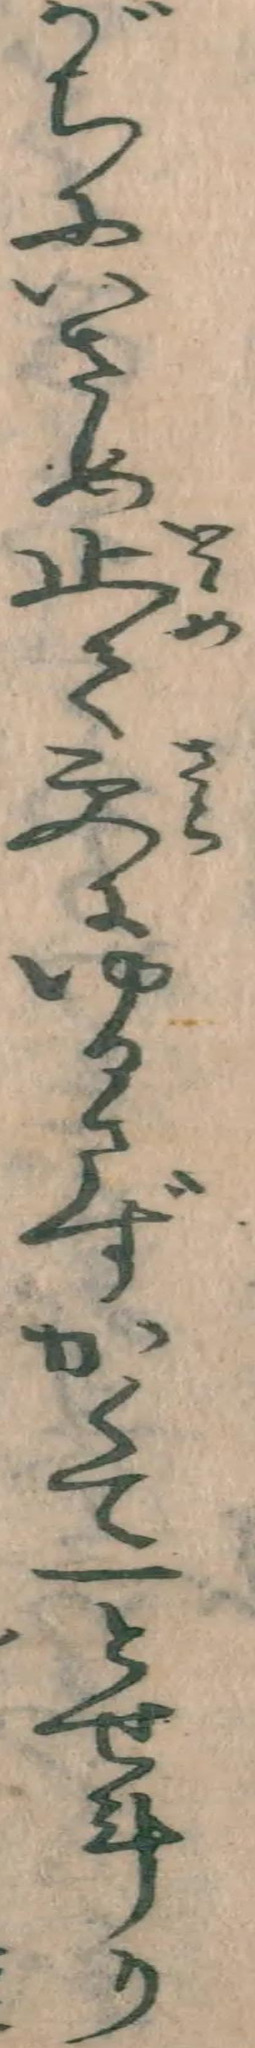がちにいさめ止て更にゆるさずかくてとせ斗り
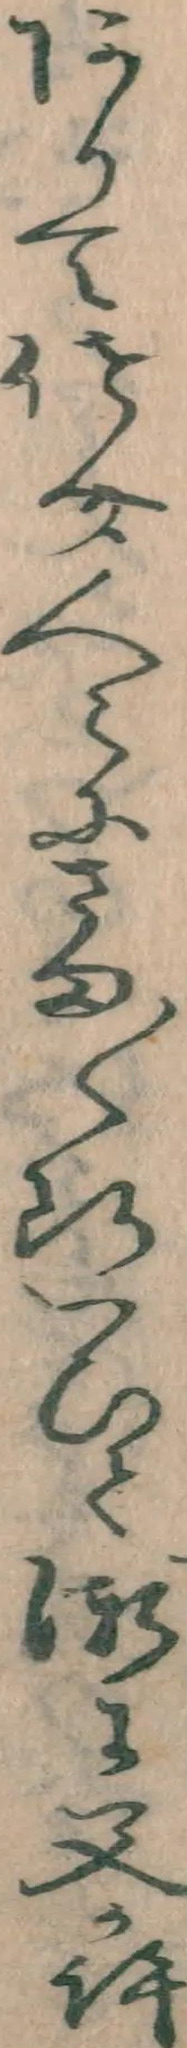ありて佐介人々にさま〳〵断いひて漸に父か許
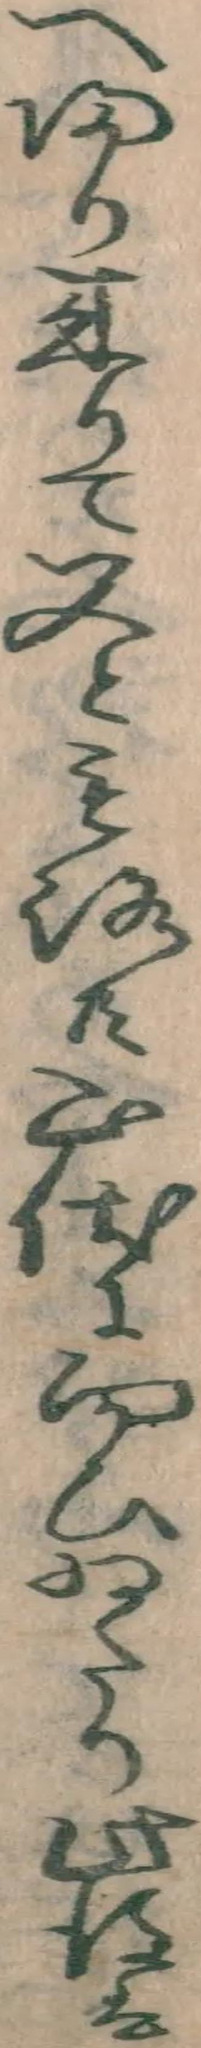へ帰り来りて父ともろ共山伏に向ひゐたり此度は
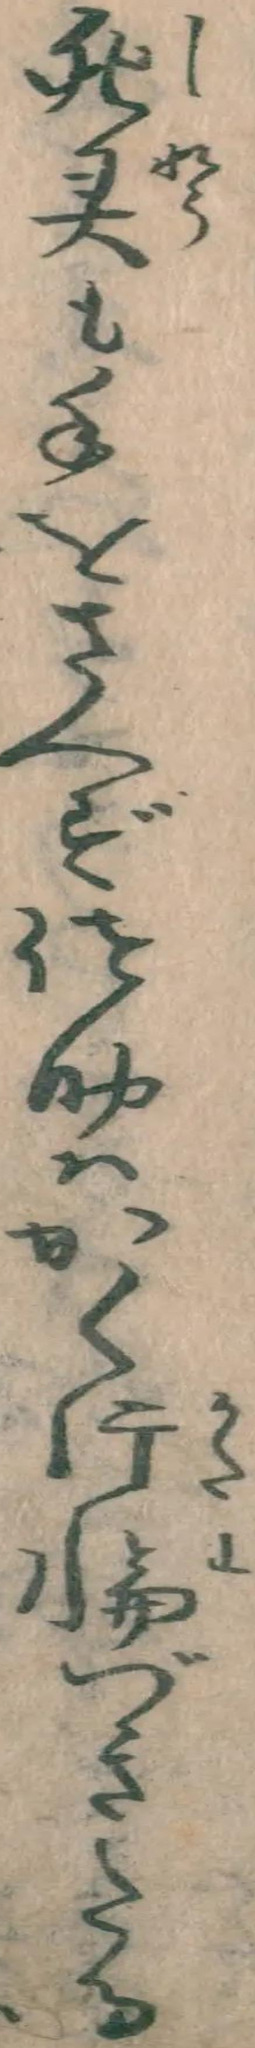死霊も手をさへず佐助はかく片輪づきたる
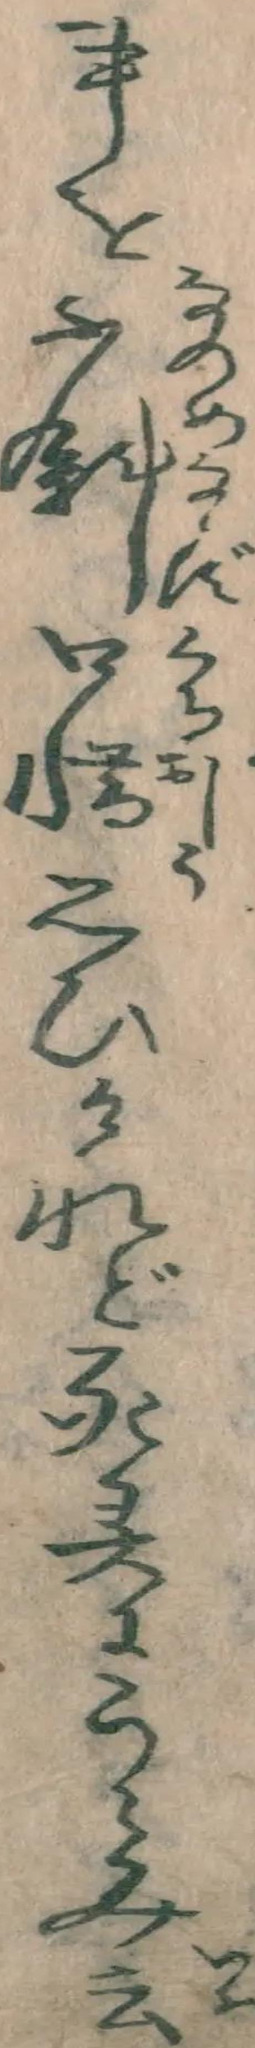事を不斜口惜思ひけれど死霊にうらみ云
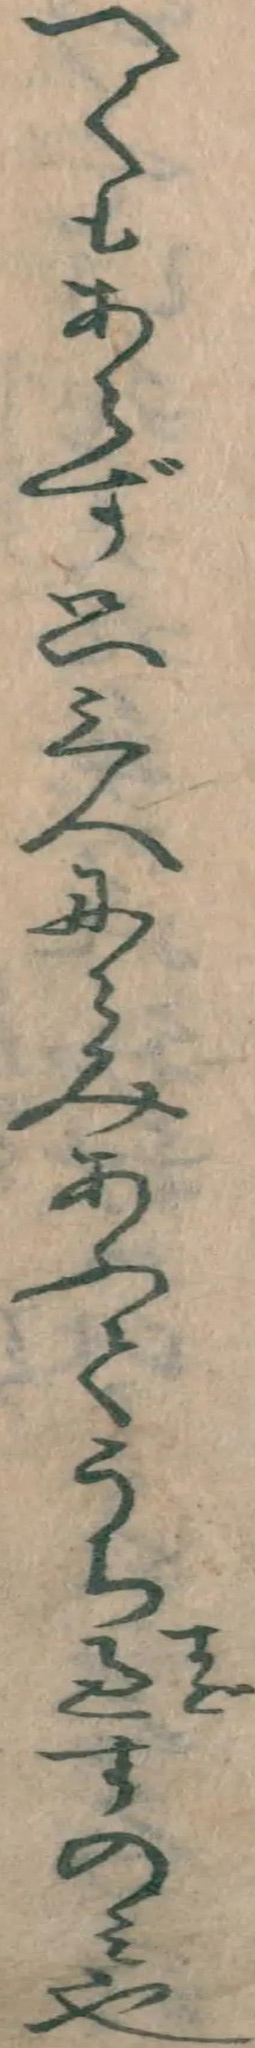へくもあらず只三人にらみあふてうち過すのみや

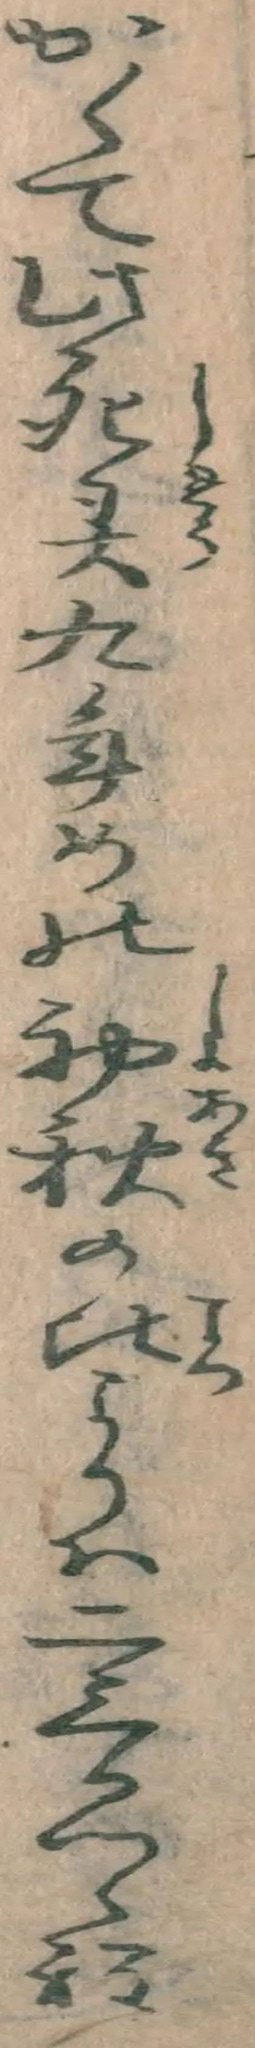かくて此死霊九年めの初秋の頃よりは二三日つゝ程
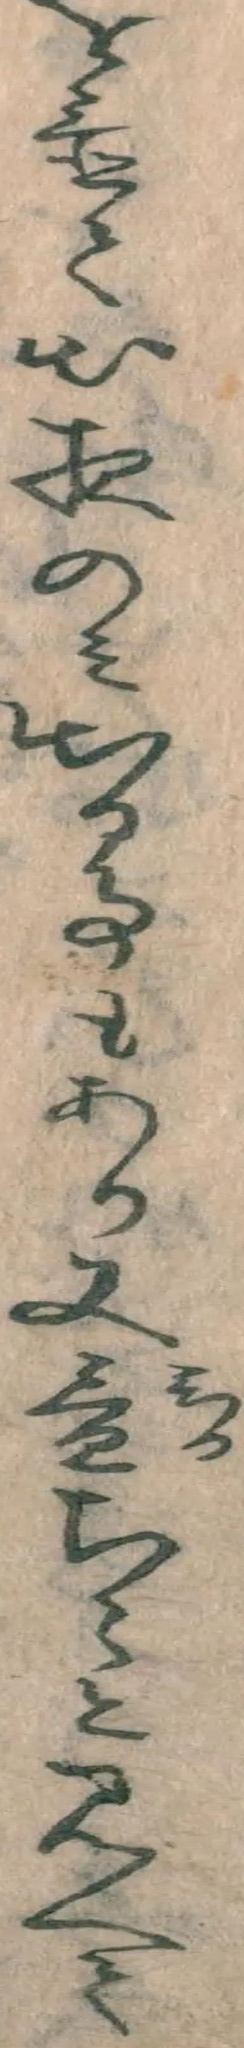を置て出夜のみ出る事もあり又昼ちらと見へて
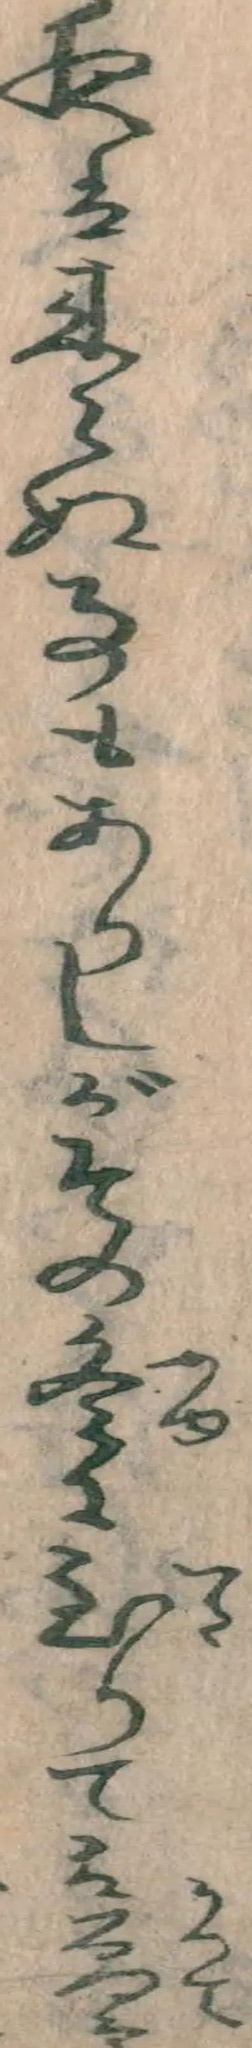夜は来らぬ事もありしがその冬に至りては曾而
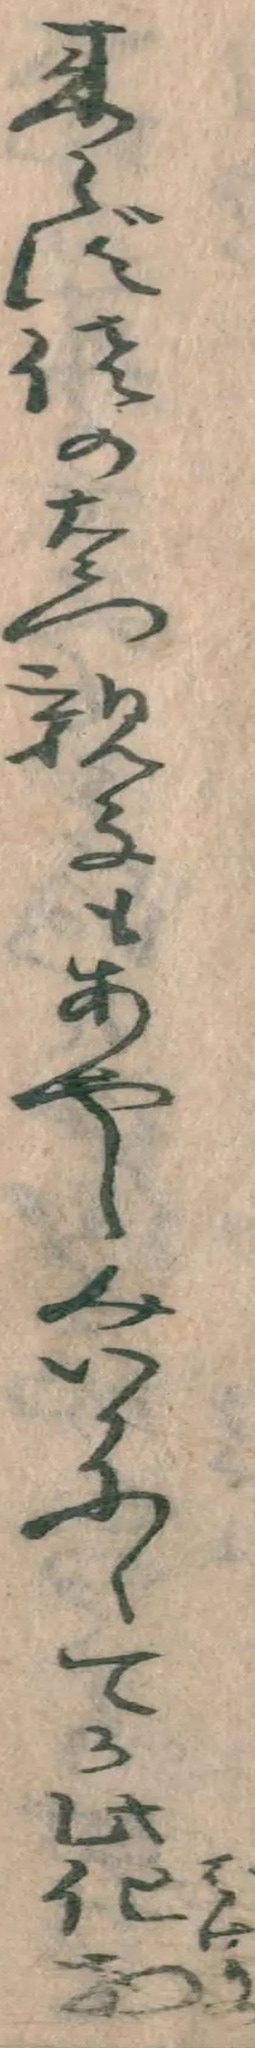来らず佐の右衛門親子もあやしみいかにしてか此化物
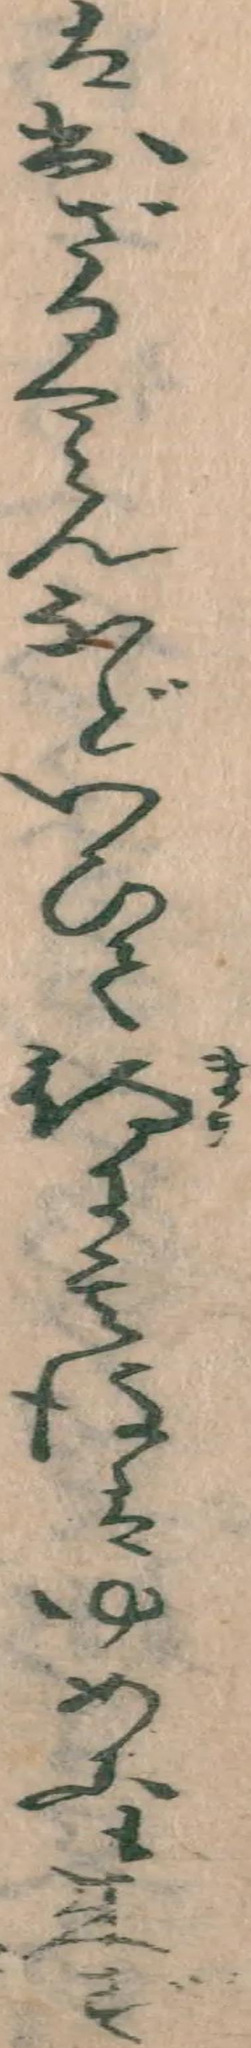は出ざるやらんなどいひて待に其後はゆめにも来ず
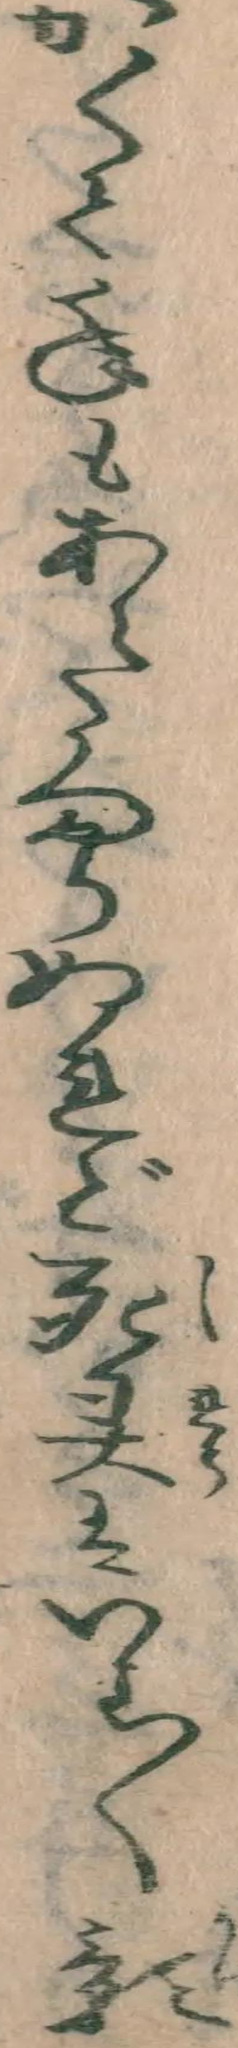かくて年もあらたまりぬれど死霊はいよ〳〵影
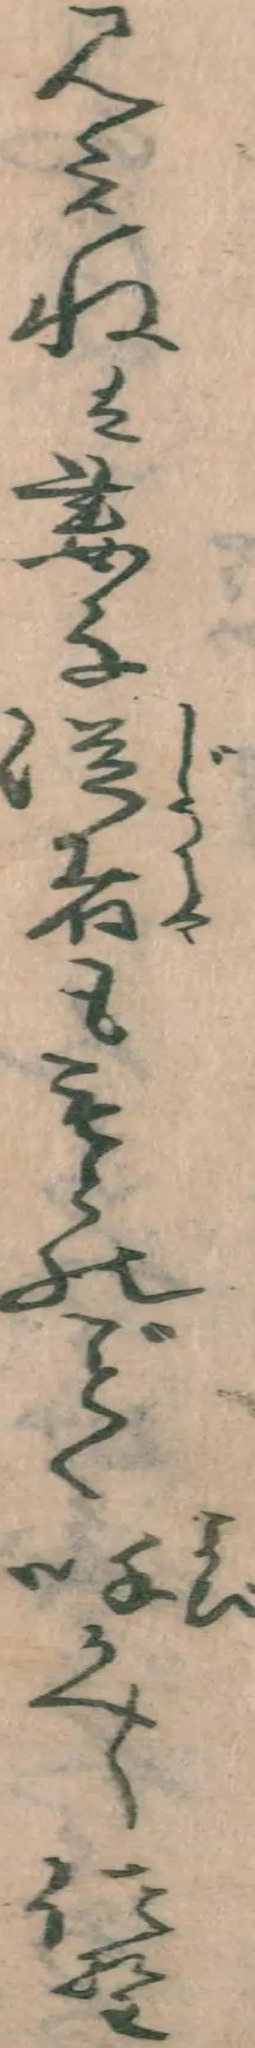見えねは妻子従者ももとのごとく呼かへし佐野
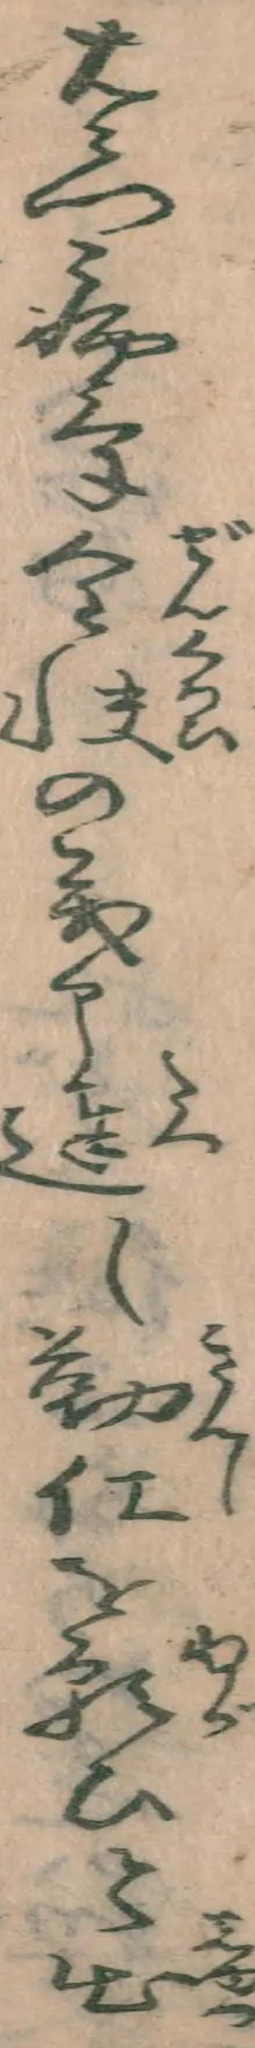右衛門病気全快の義申達し勤仕を願ひて出
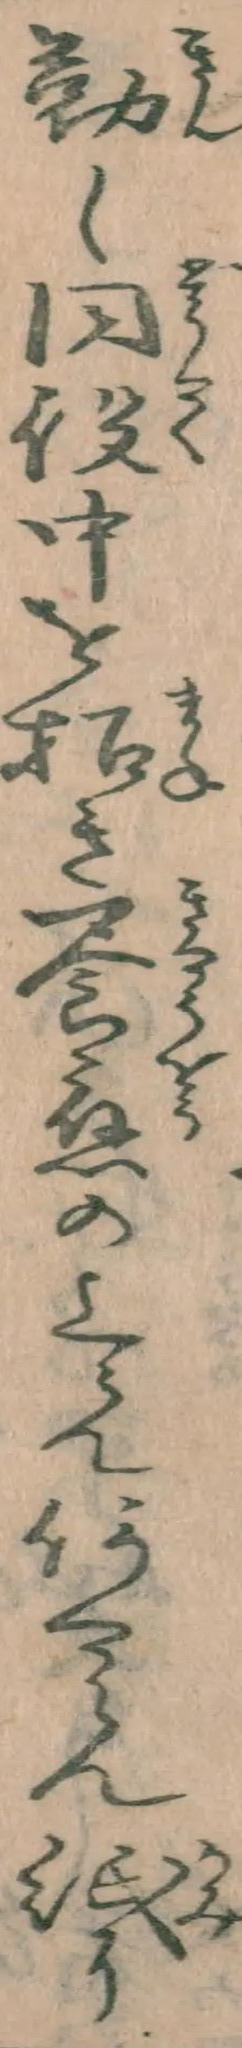勤し同役中を招き饗応の上にて何やらん紙に
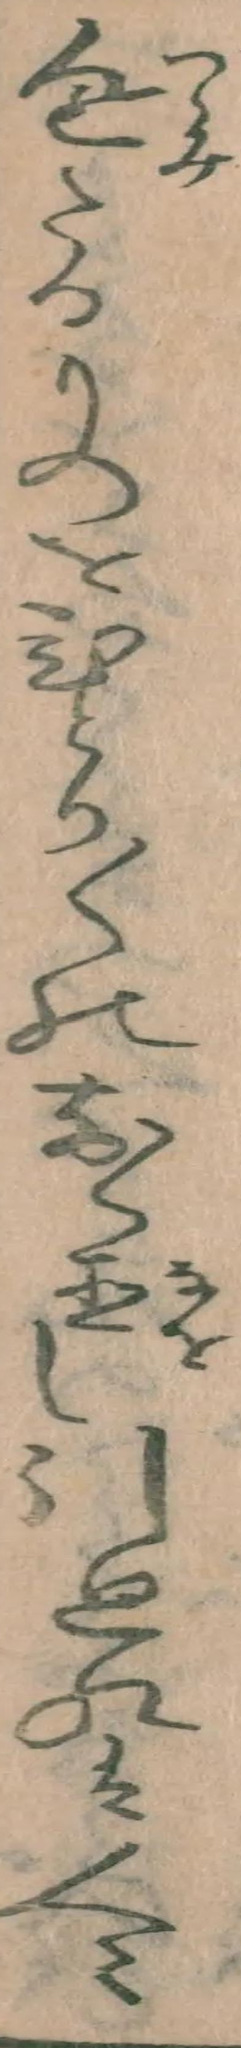包たるものをひとり〳〵の前へ直し引廻れは人々
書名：怪談御伽童 5巻. [2]
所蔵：国立国会図書館 National Diet Library, JAPAN
